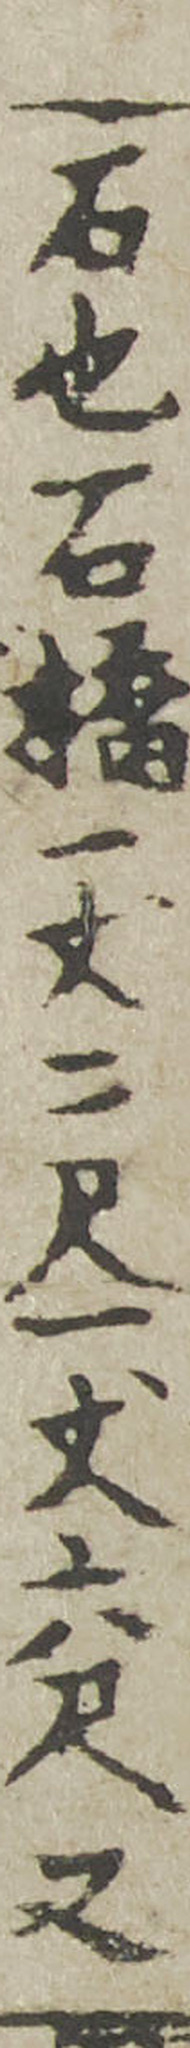石也石橋一丈二尺一丈六尺又
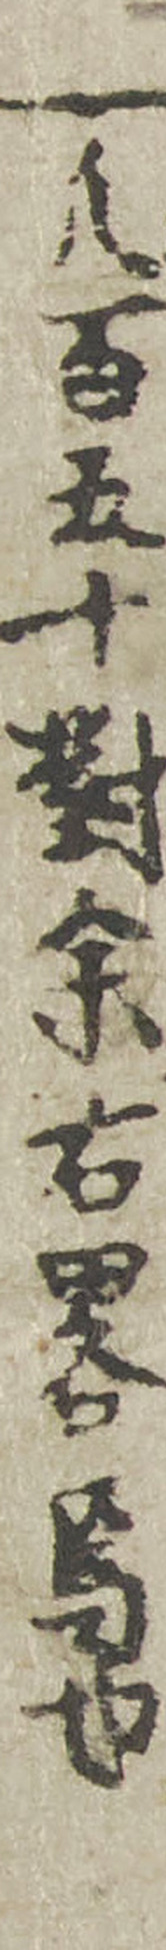凡百五十対余右畧焉也
